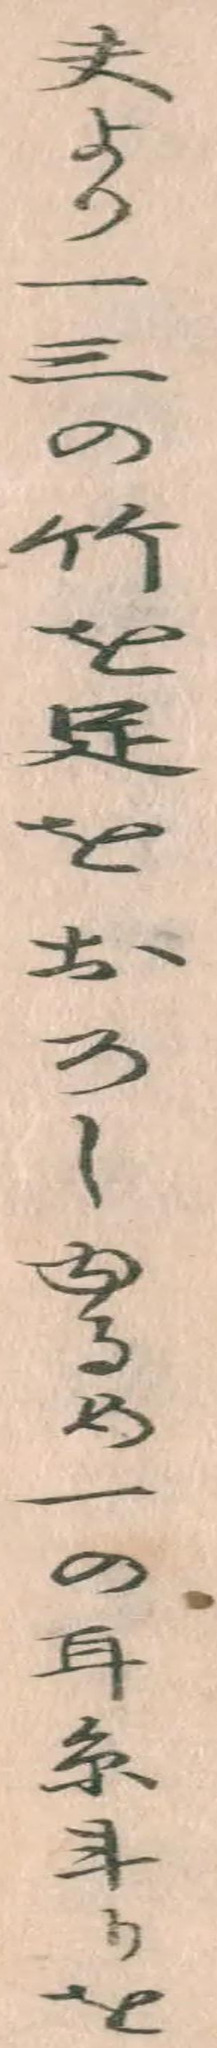夫より一三の竹を足をおろしゆるめ一の耳糸斗りを
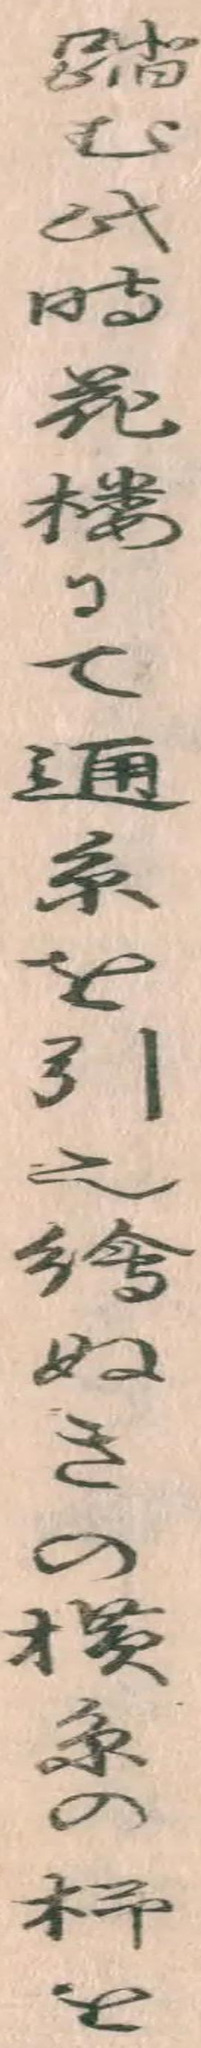蹈む此時花楼にて通糸を引也絵ぬきの横糸の杼を
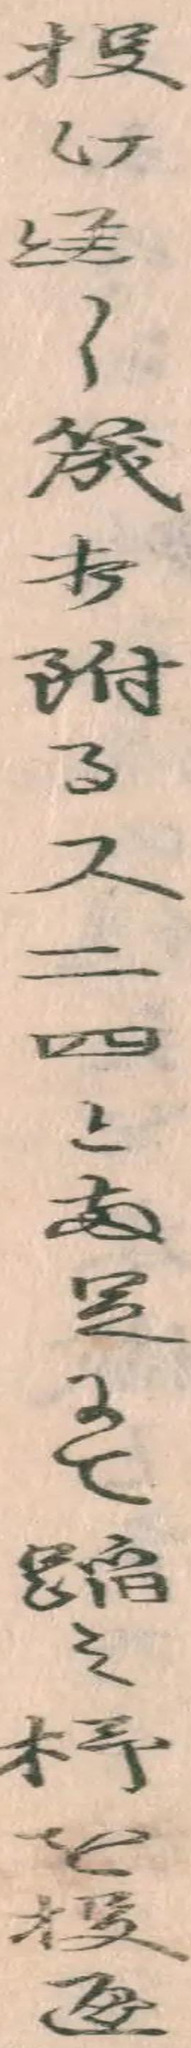投け通し筬打附る又二四と両足にて蹈み杼を投通
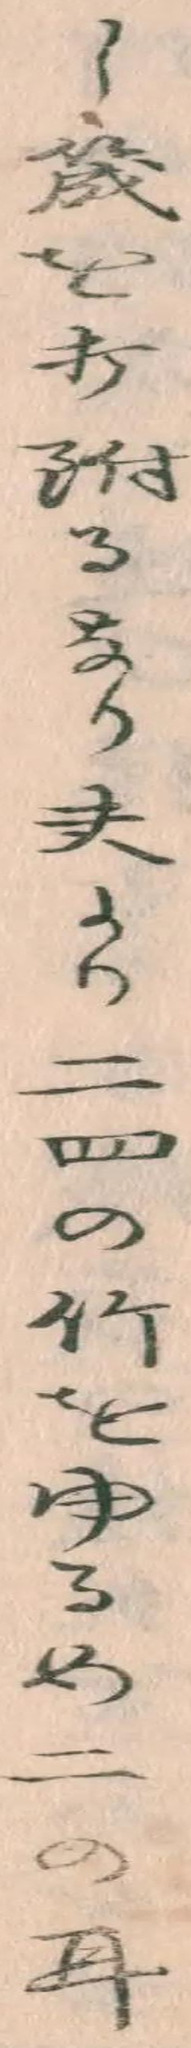し筬を打附るなり夫より二四の竹をゆるめ二の耳
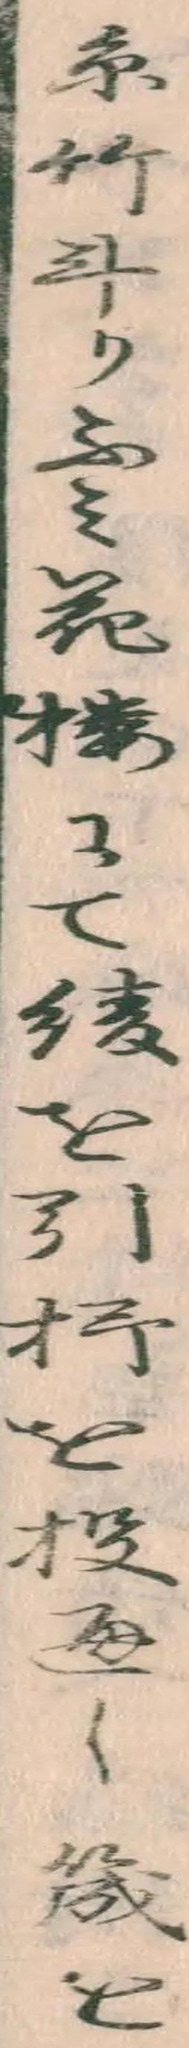糸竹斗りふみ花楼にて綾を引杼を投通し筬を
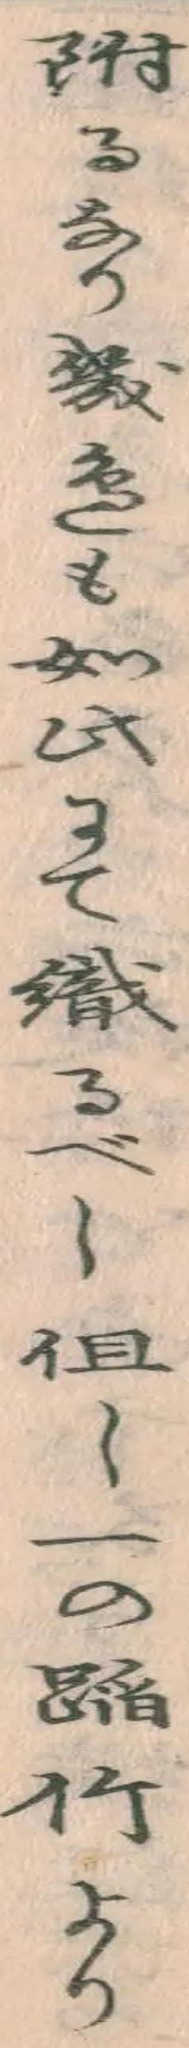附るなり幾辺も如此にて織るべし但し一の蹈竹より
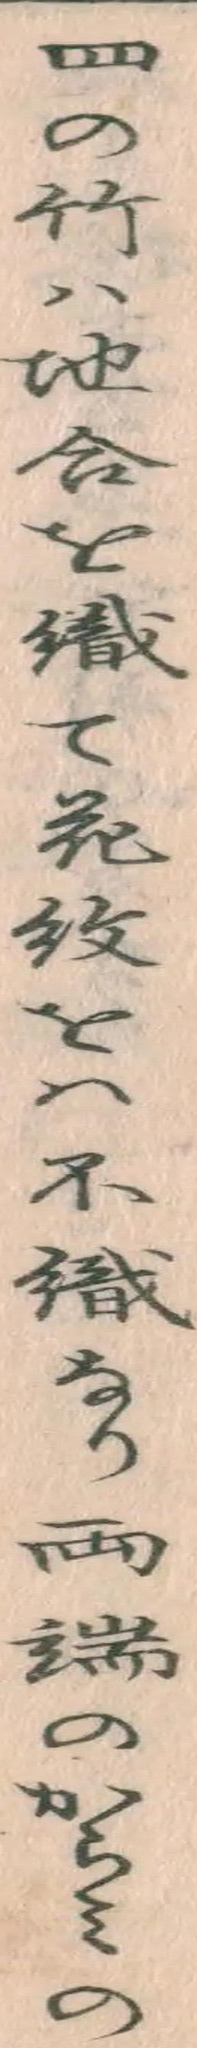四の竹は地合を織て花紋をは不織なり両端のからみの
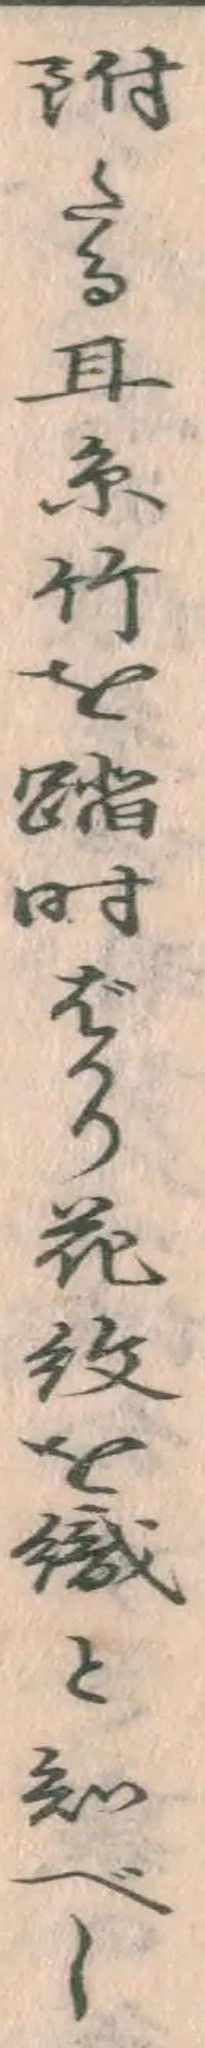附たる耳糸竹を蹈時ばかり花紋を織と知べし

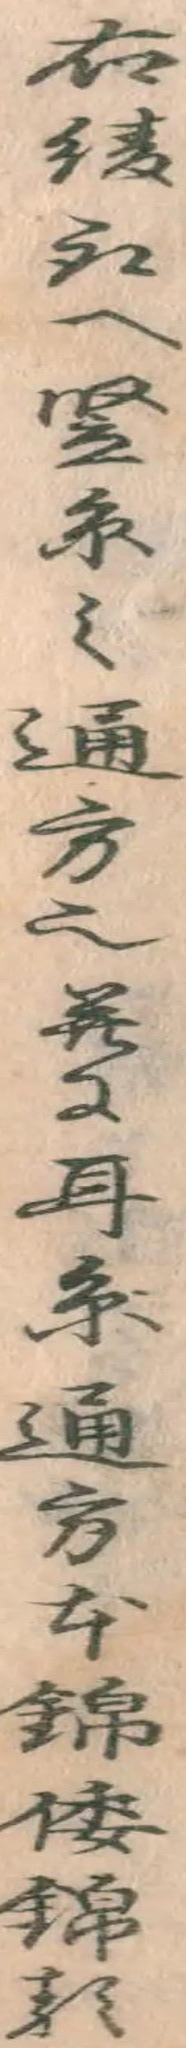右綾取へ竪糸之通方也幷に耳糸通方本錦倭錦類
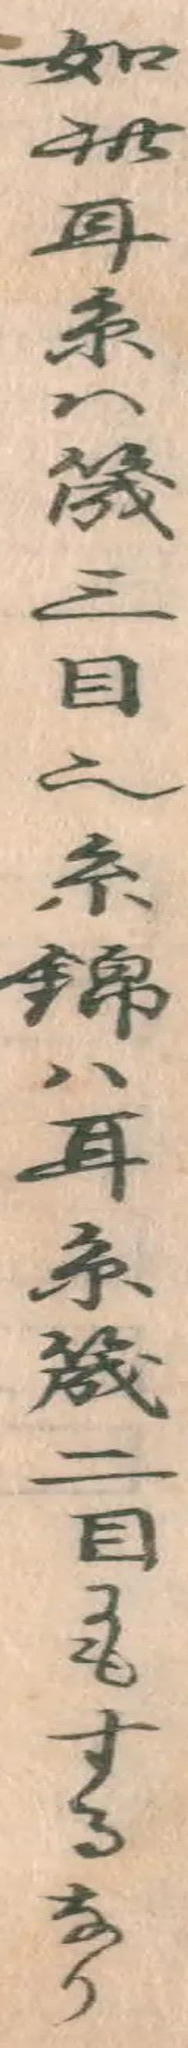如此耳糸は筬三目也糸錦は耳糸筬二目にもするなり
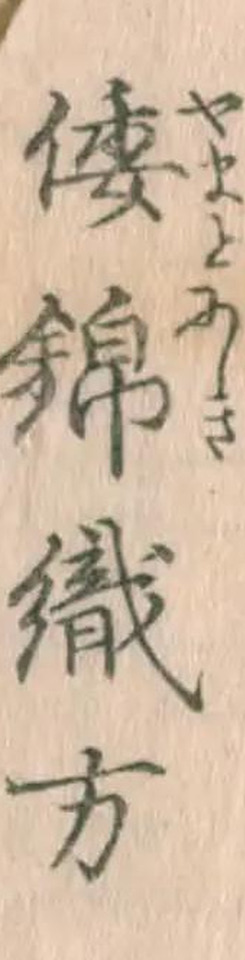倭錦織方
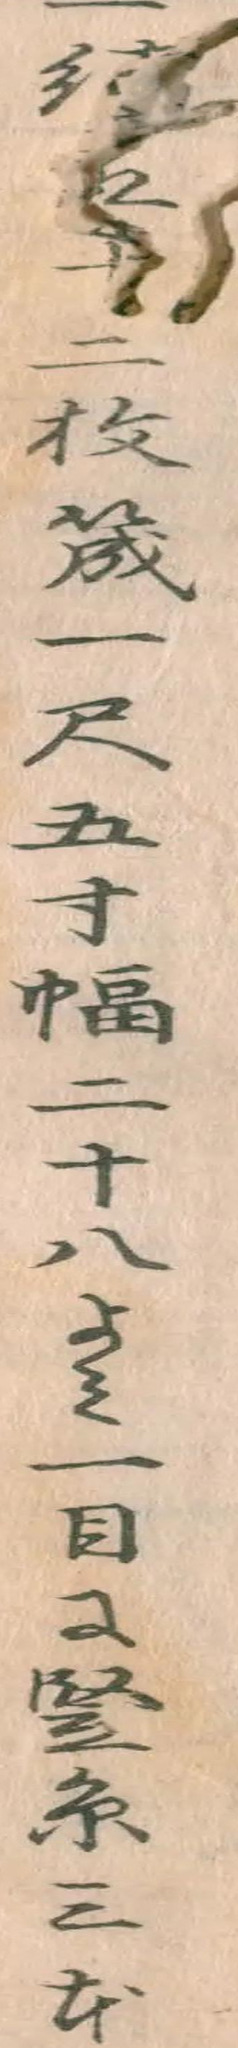一綾取十二枚筬一尺五寸幅二十八よみ一目に竪糸三本
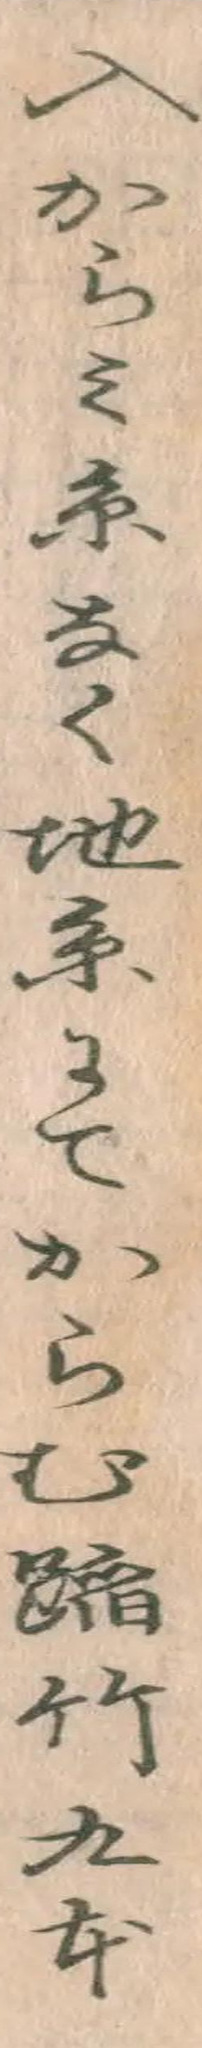入からみ糸なく地糸にてからむ蹈竹九本
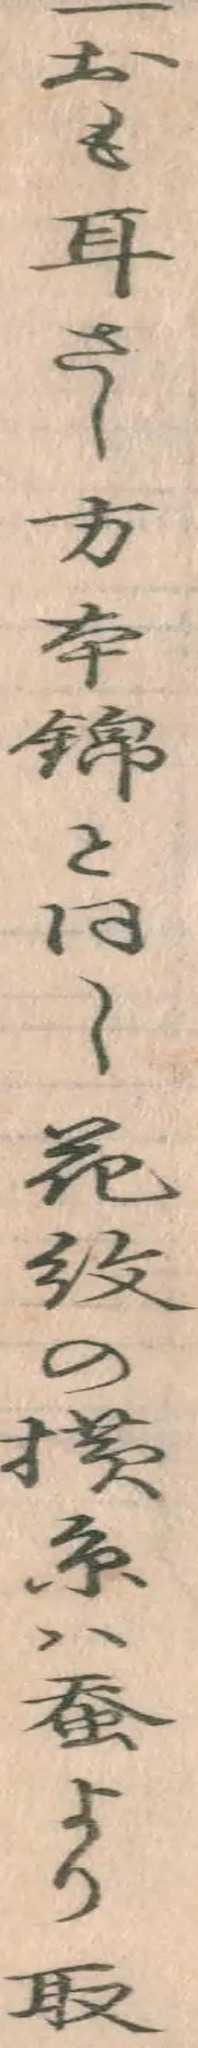一おも耳さし方本錦と同し花紋の横糸は蚕より取
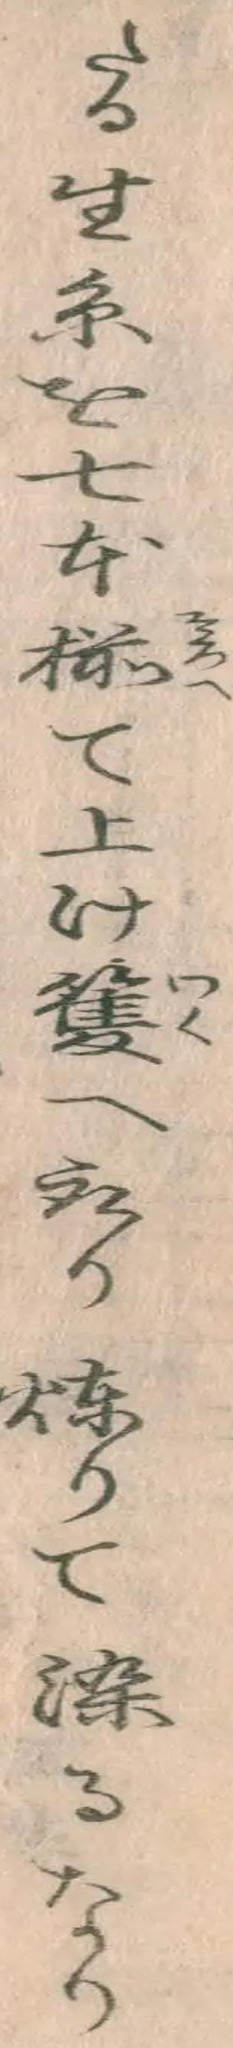たる生糸を七本揃て上け篗へ取り煉りて染るなり
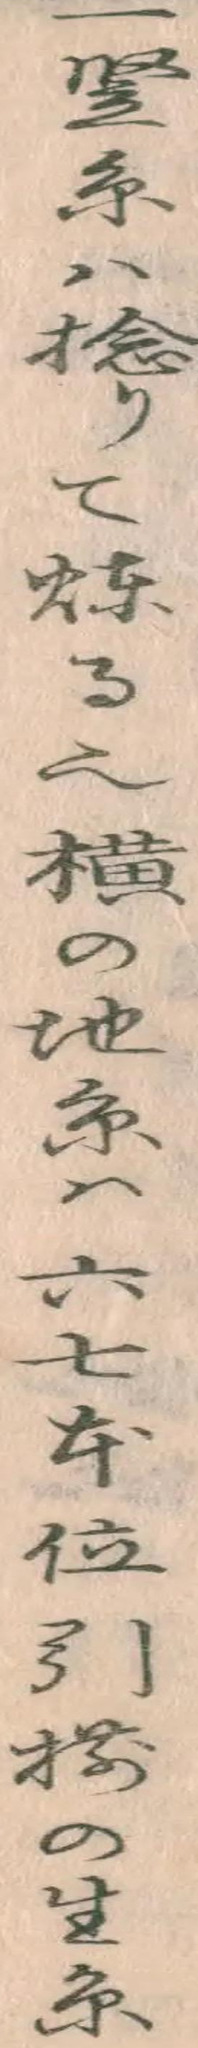一竪糸は捻りて煉る也横の地糸は六七本位引揃の生糸
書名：機織彙編 5巻. [2]
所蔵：国立国会図書館 National Diet Library, JAPAN
